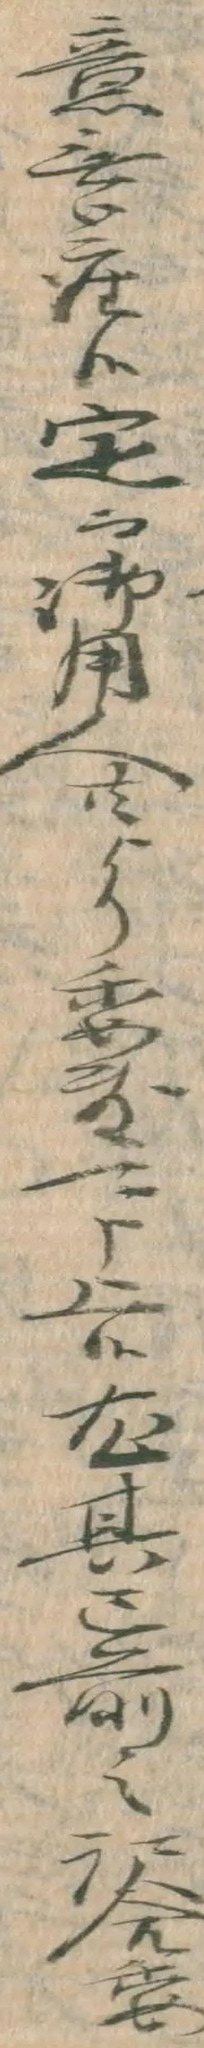意無御座候定而御用人共より委敷可申上候尤其已前之訳合委
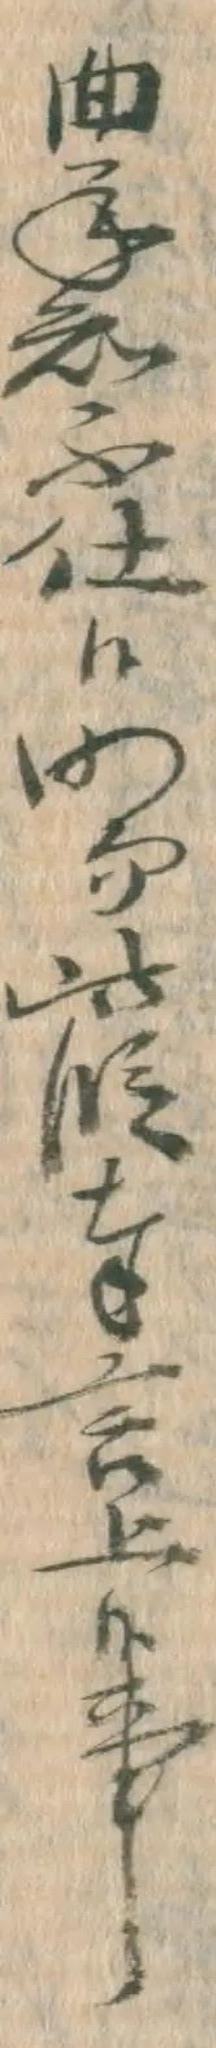面承知不仕候仍而此段奉言上候事
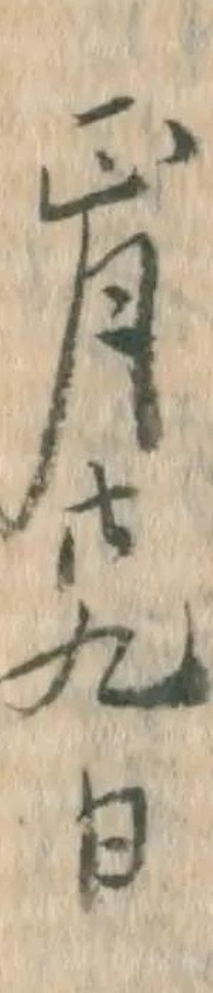正月廿九日
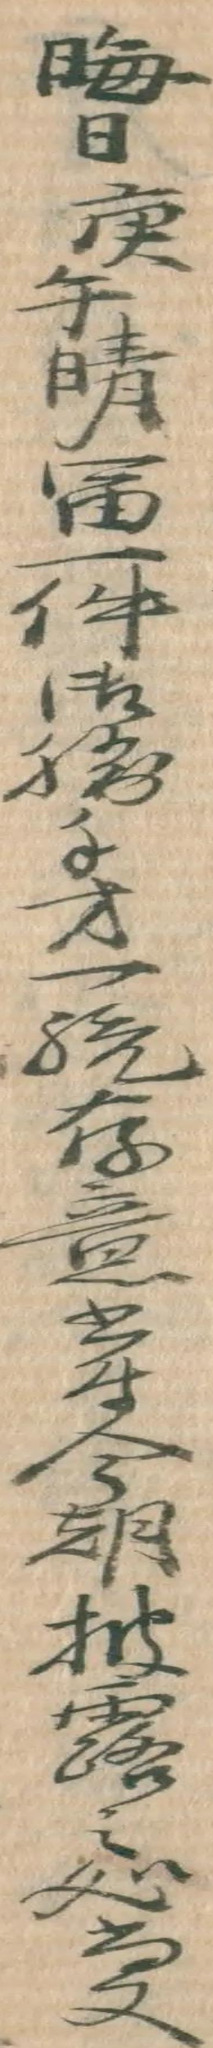晦日庚午晴富一件御勝手方一統存意書付今朝披露之処尚又
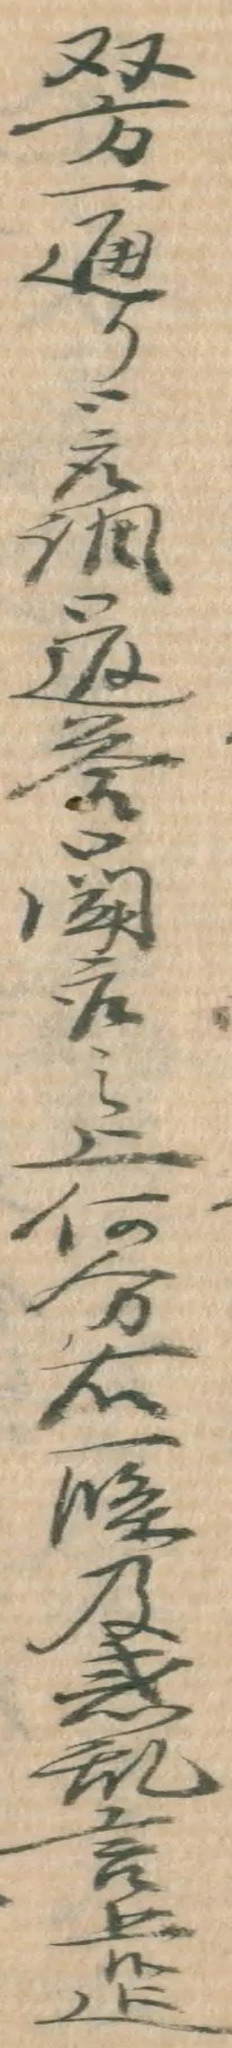双方一通り御取調御返答御聞取之上何分右一條及惑乱言上候迄
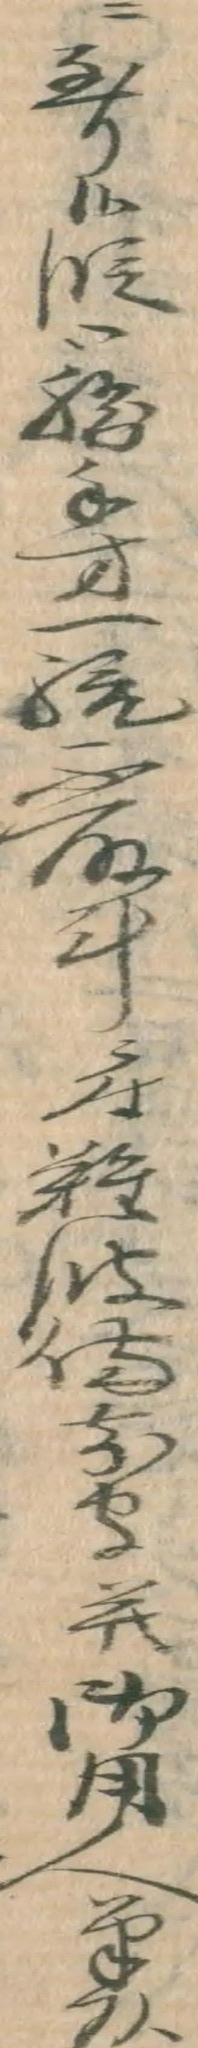ニ至り候段御勝手方一統不取計ニ付難波備前守并御用人筆改
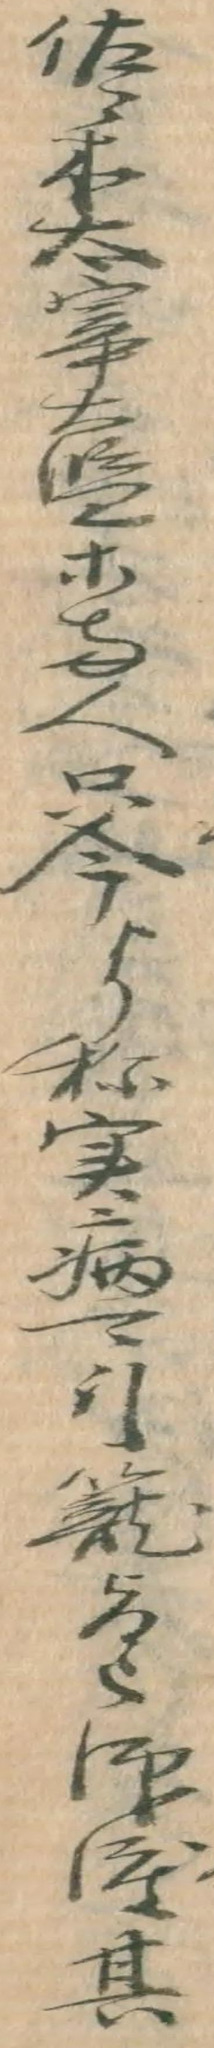佐々木太宰大監等両人只今より称実病可引籠旨被仰渡其

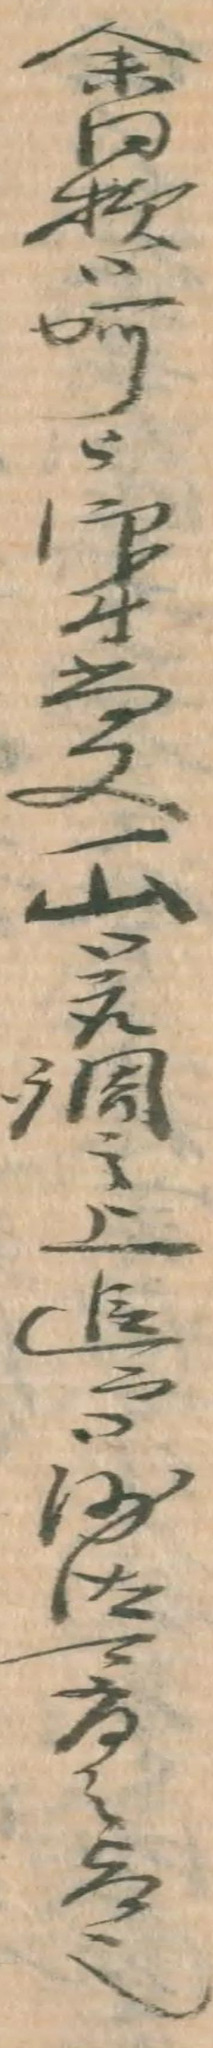余同様御所被仰付尚又一山御取調之上追而御沙汰可有之旨也
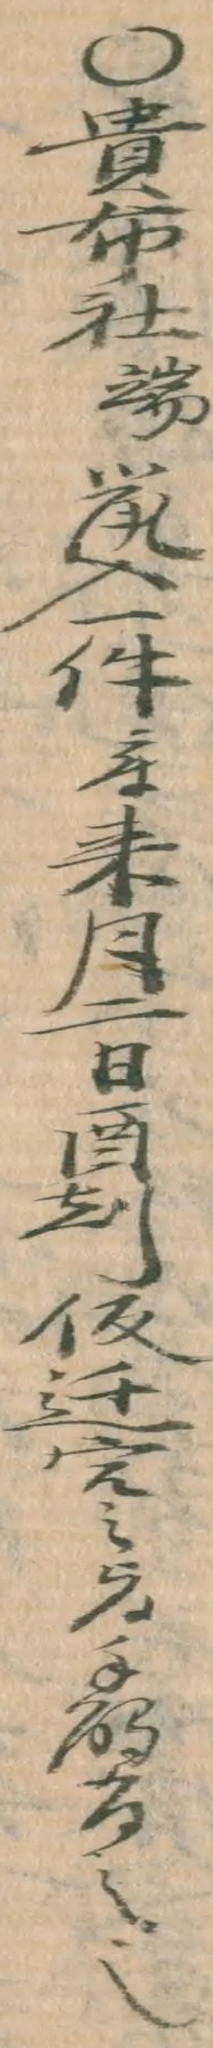○貴布社端鼠入一件二付来月二日酉刻仮遷宮之旨手触有之也
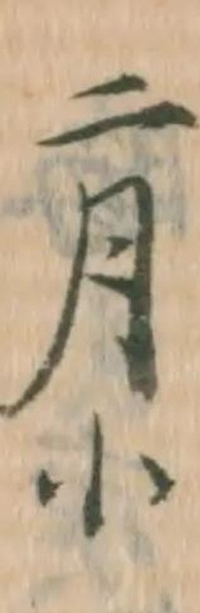二月小
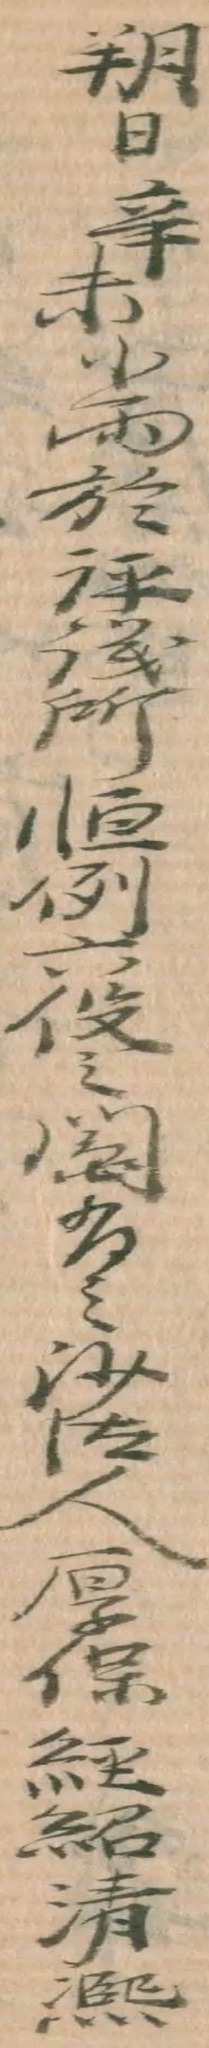朔日辛未小雨於評議所恒例六役之鬮有之沙汰人厚保経紹清熙
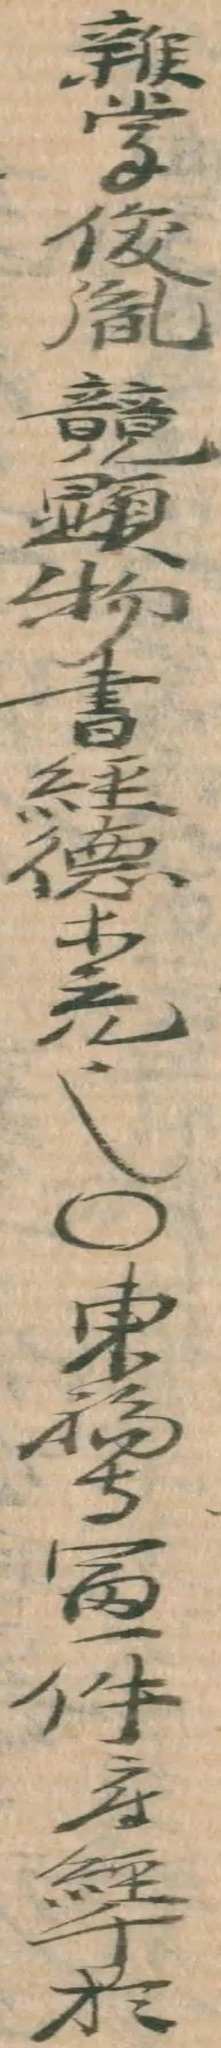雑掌俊胤競顕物書経徳等充也○東福寺冨一件ニ付経千於
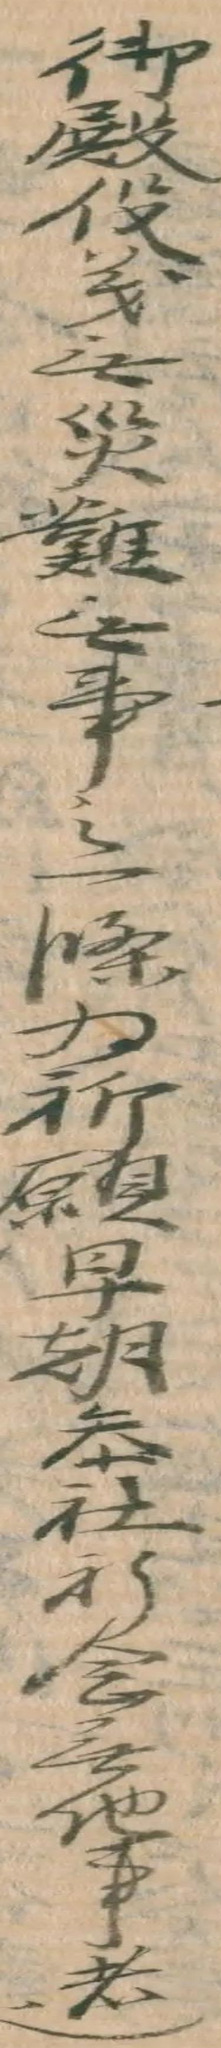御殿役義無災難無事之一條為祈願早朝参社折念無他事者也
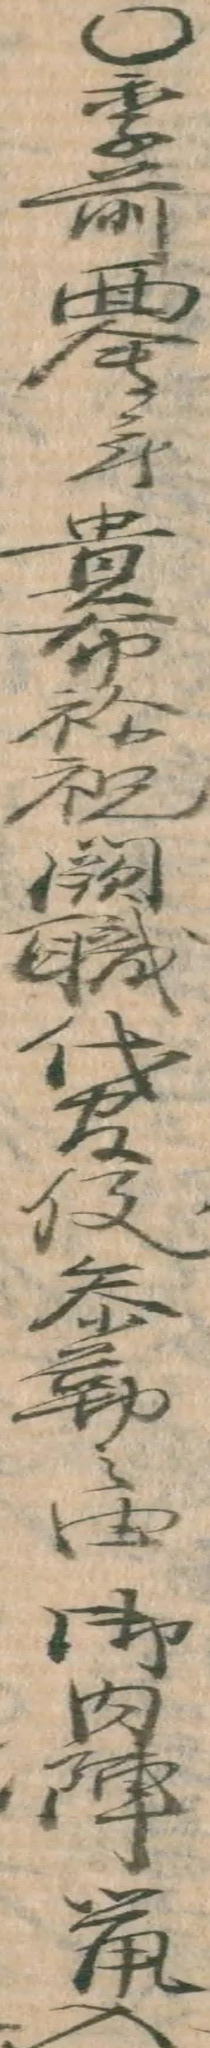○季前面會ニ付貴布祢祝闕職代官役参勤之由御内陣鼠入
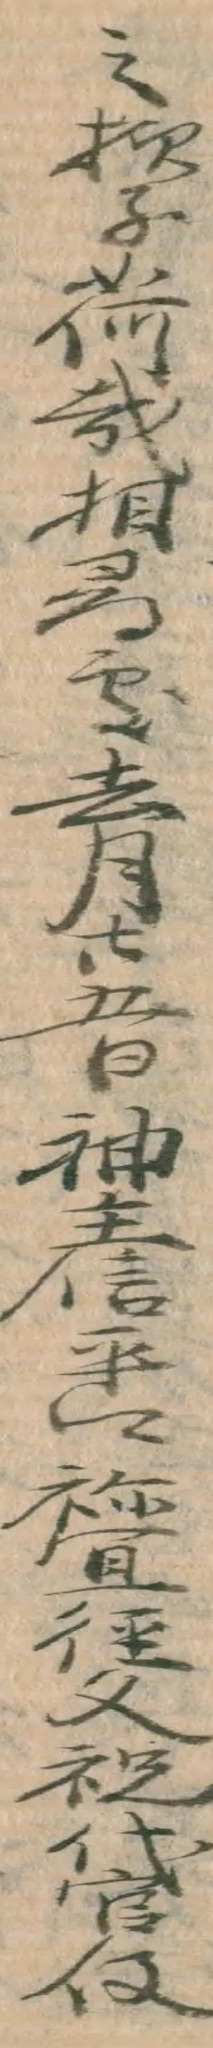之様子如何哉相尋處去月廿五日神主信平卿祢宜径久祝代官役
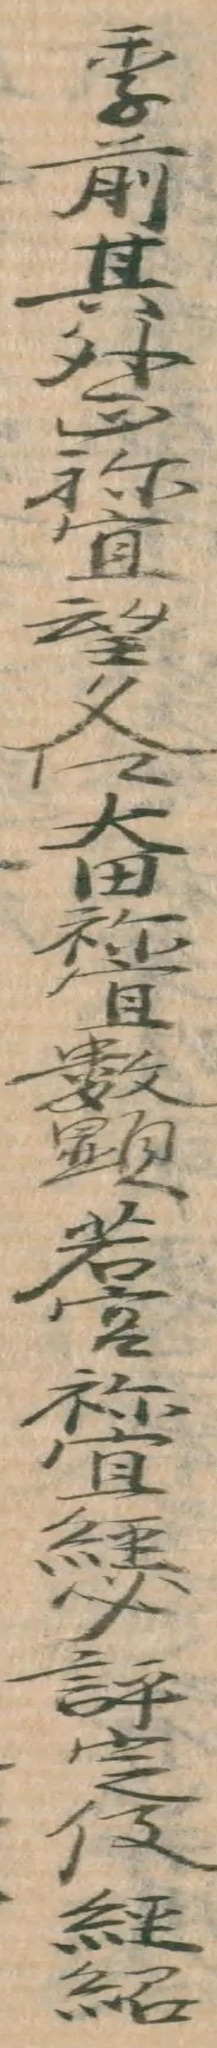季前其外正称宜望久卿大田祢宜数顕若宮称宜経必評定役経紹
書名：賀茂社記録. 第65冊
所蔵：国立国会図書館 National Diet Library, JAPAN
